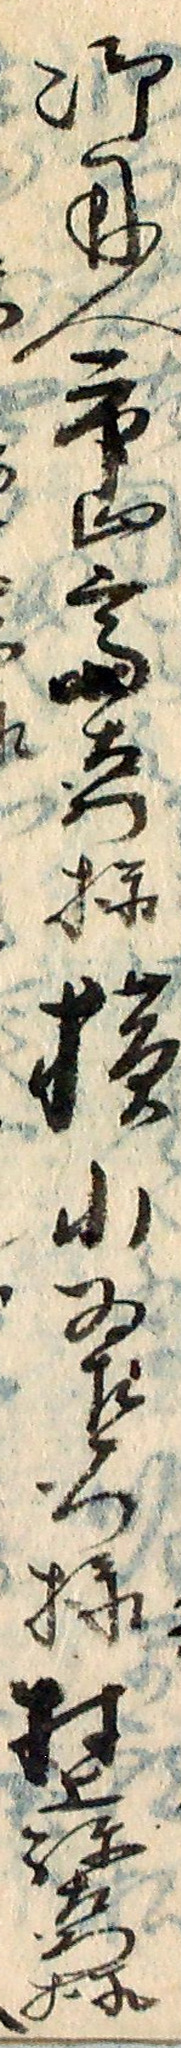御用人市正富左衛門様横川為左衛門様村上弥左衛門様
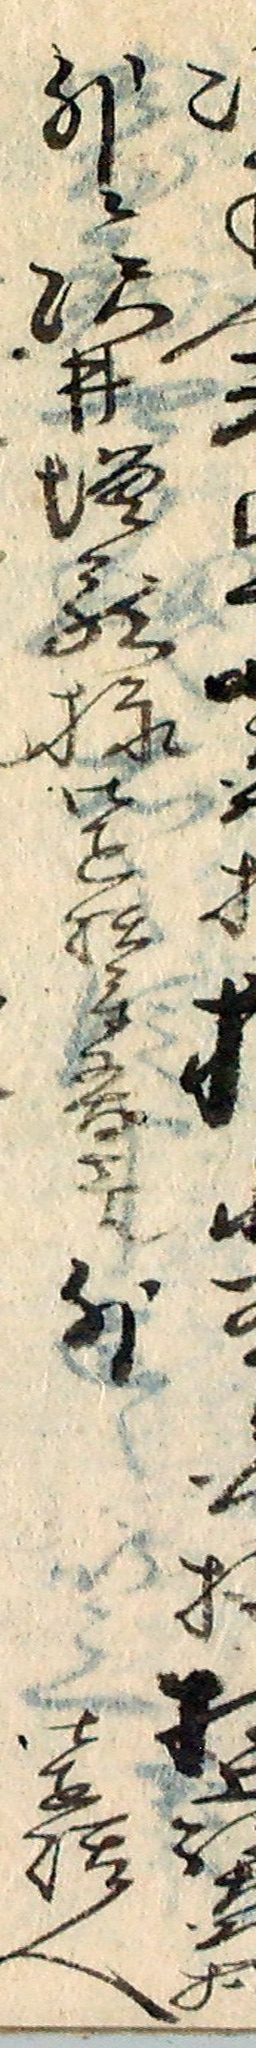外に沢井増蔵様御世話に付肴上る外御世話人
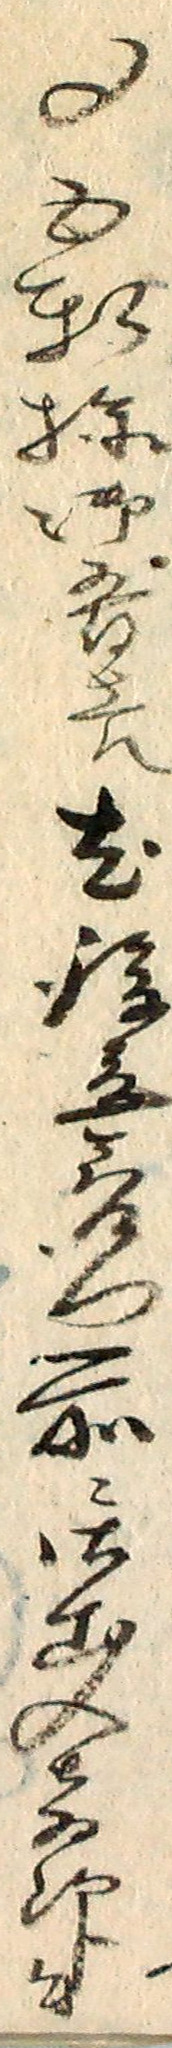〆五軒様御肴上る尤後藤善右衛門前に御出入被為仰付
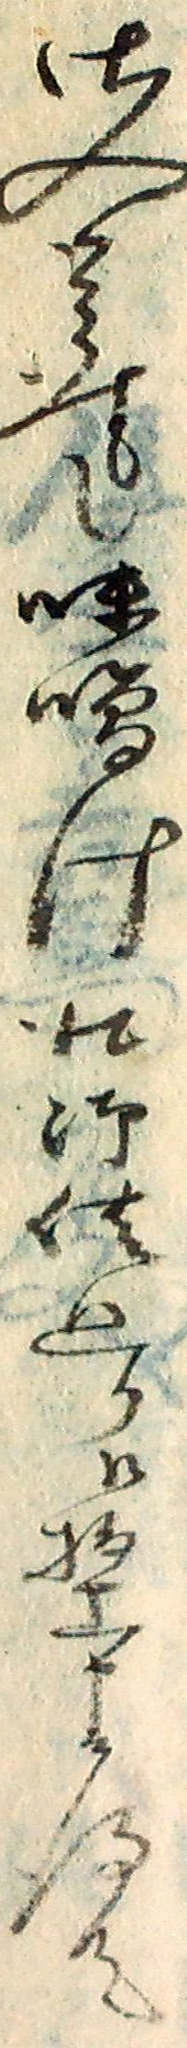御入御座候味噌汁仕御供廻りえ指上申候得共
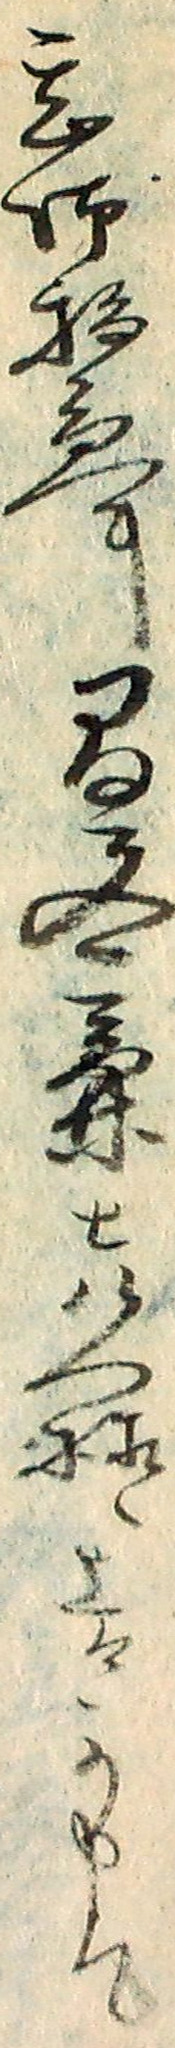甚御指急き間に合兼七八人様へ上け可申上候

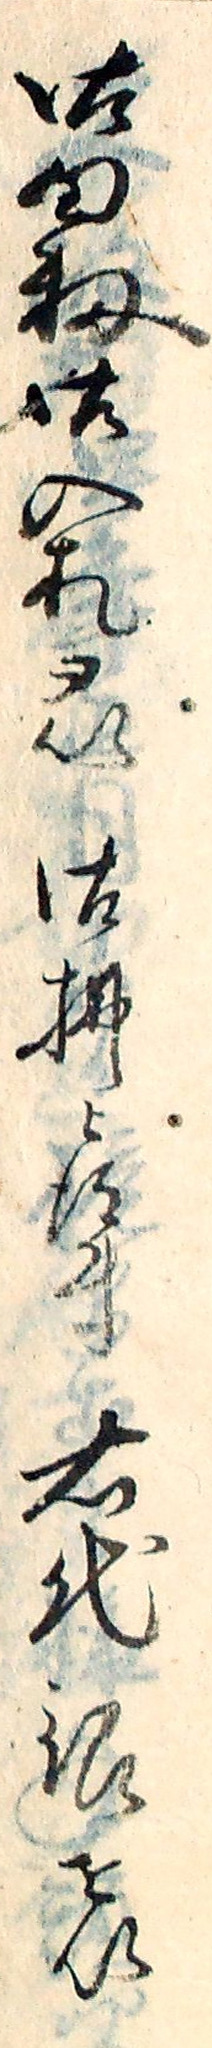御田籾御入札を以御払被仰付右代銀を以
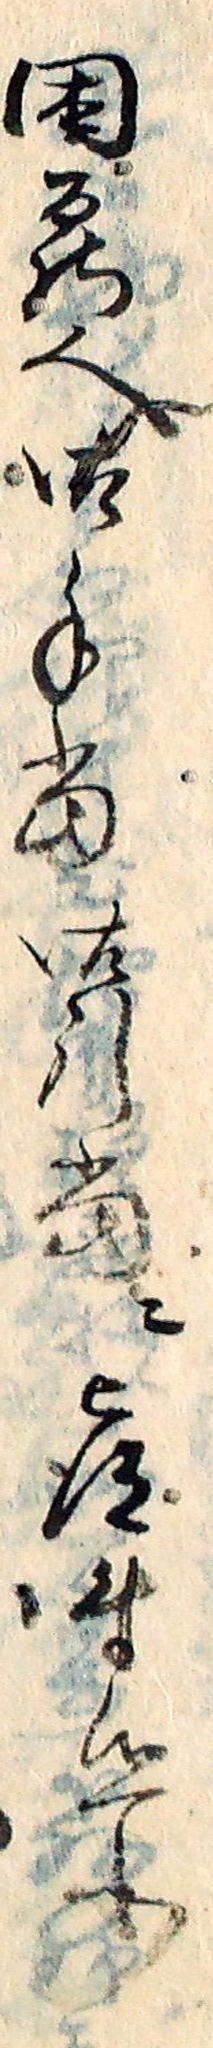困窮人御手当御引当に被仰付候所
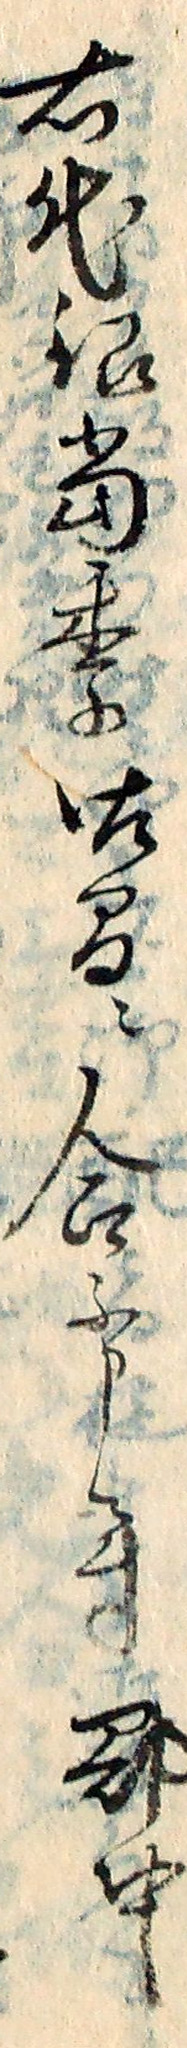右代銀当季御間に合不申に付郡中
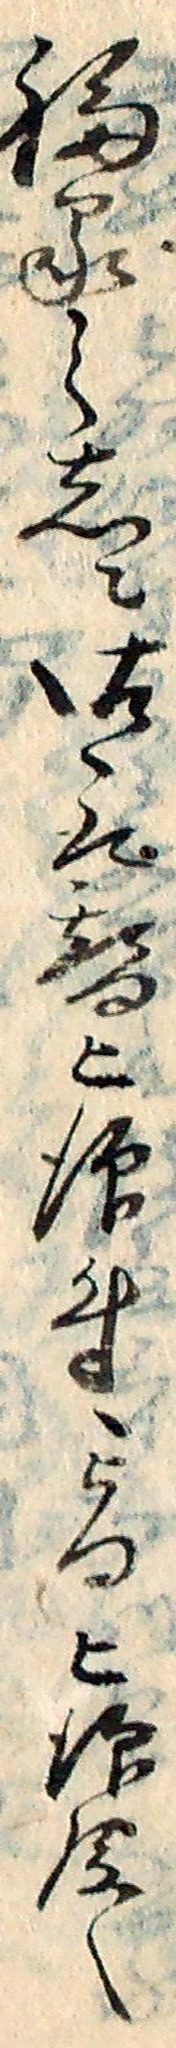福家之者に御取替被仰付候旨被仰渡候
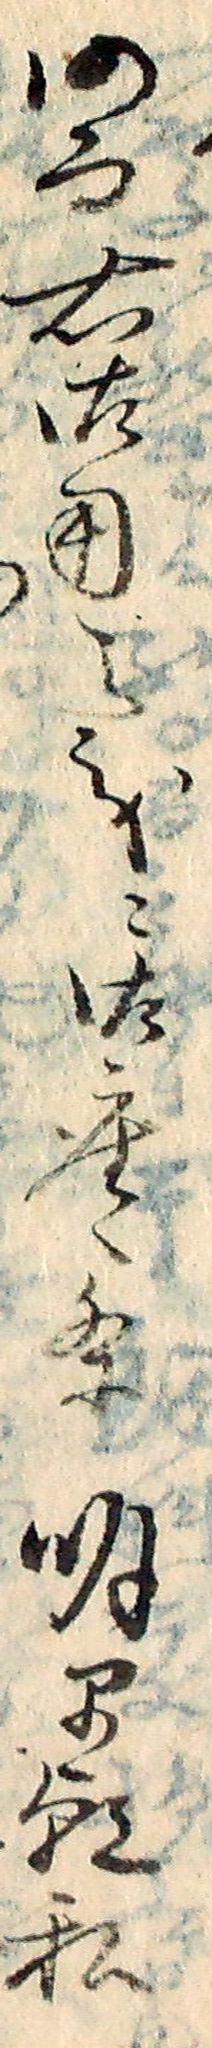仍て右御用之義に御座候条明早朝私宅へ
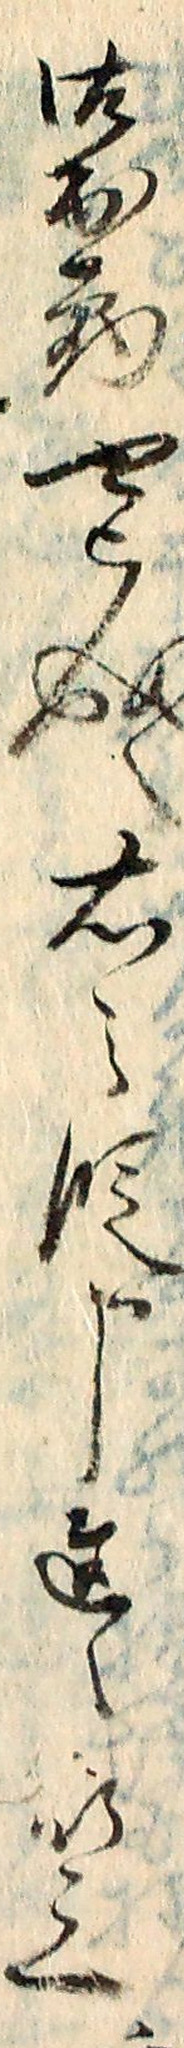御出勤可被成候右之段申達候以上
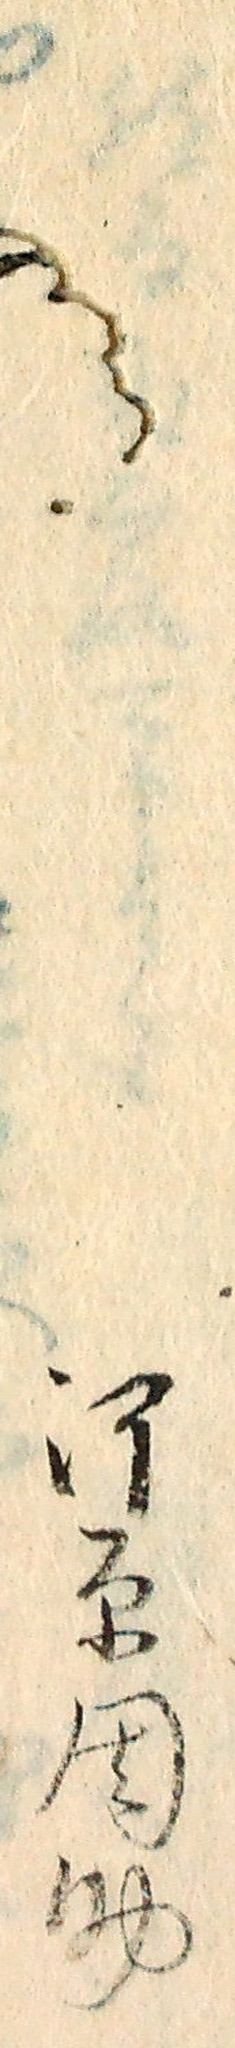河原周助
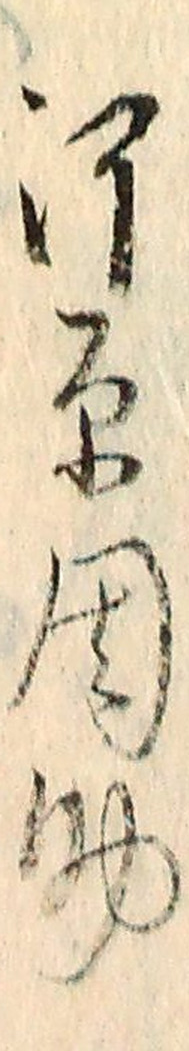河原周助
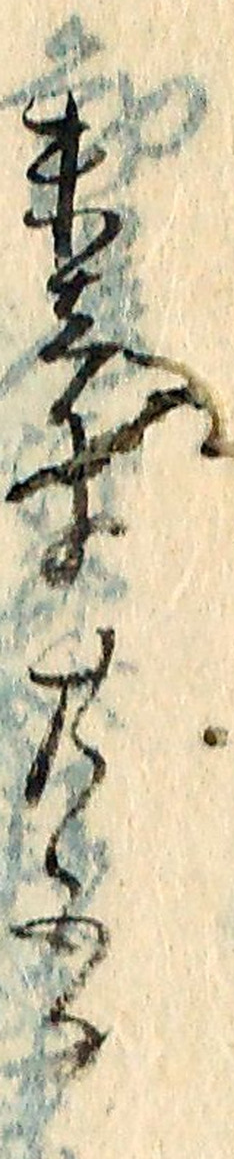未十二月廿五日
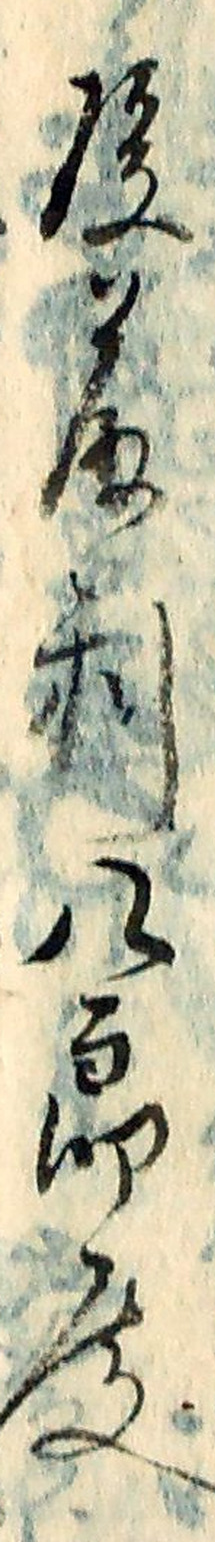後藤利八郎殿
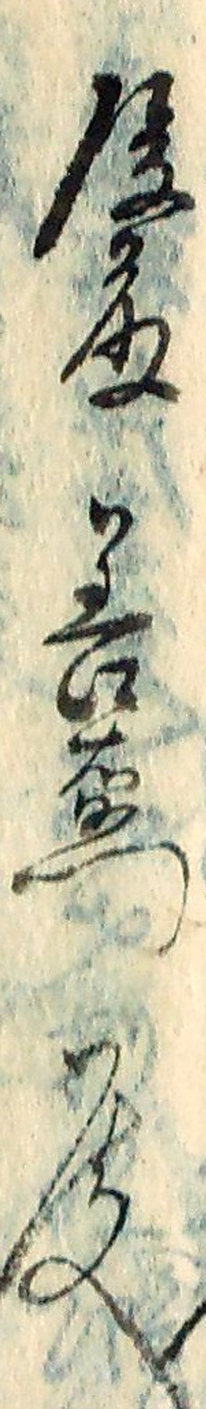後藤善右衛門殿
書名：諸御願書控(後藤氏壱番）
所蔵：鳴門教育大学 Naruto University of Education
